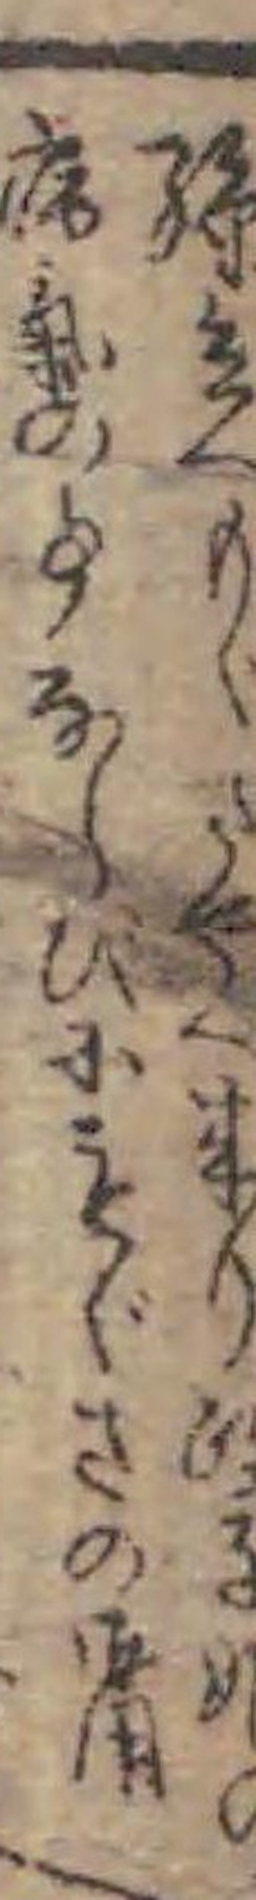病気の事ならびにもぐさの御用
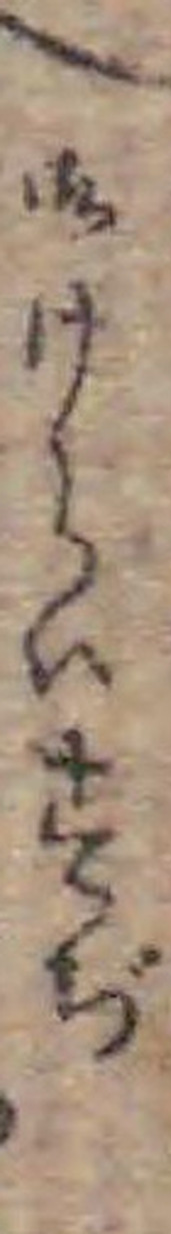御けらいすぢ
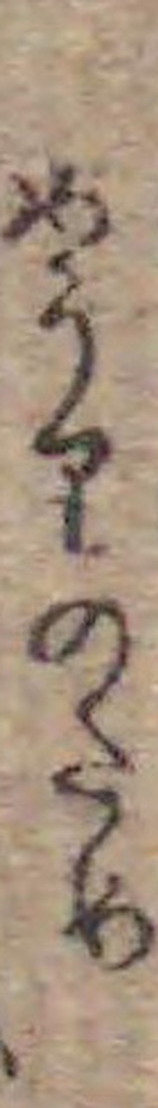めうりのため
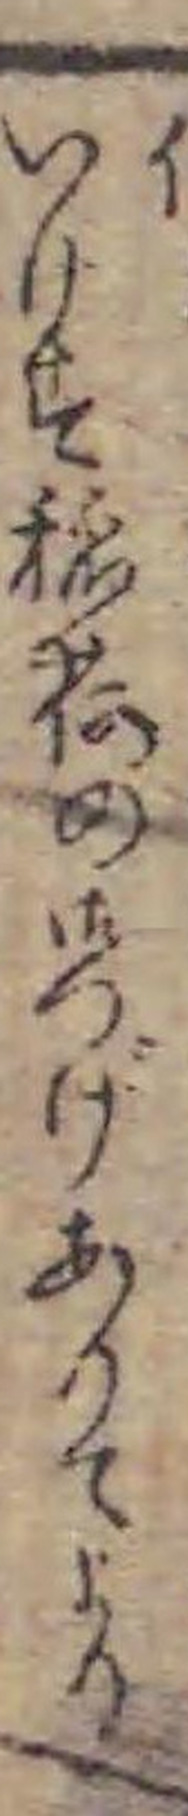いけす稲荷の御つげありてより
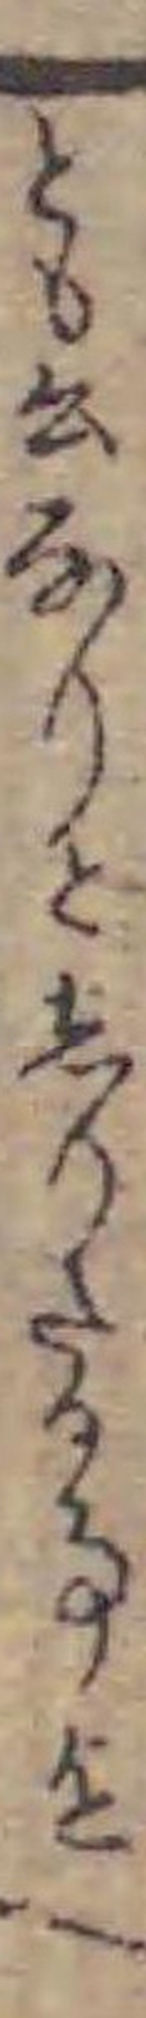とも公なりとしりたる事迄
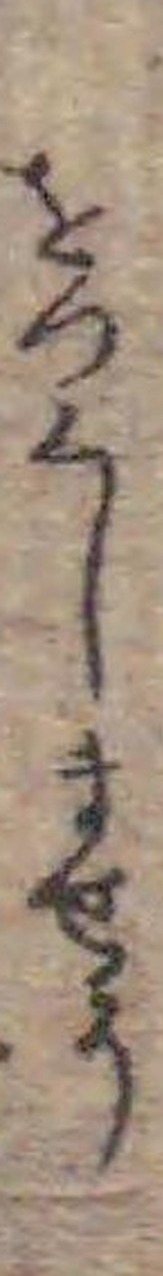をつくしませう
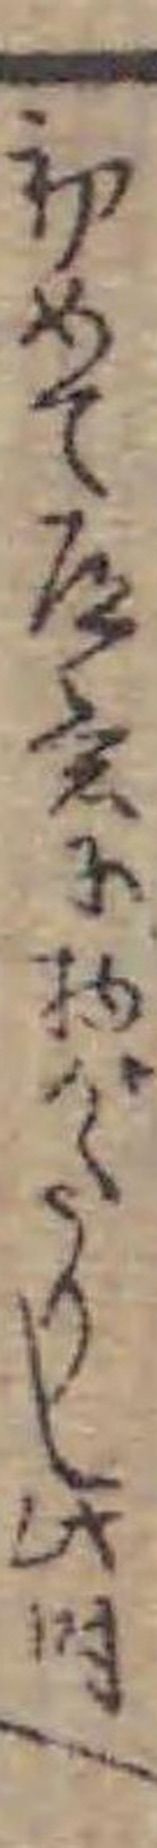初めて道意に物がたりし此時
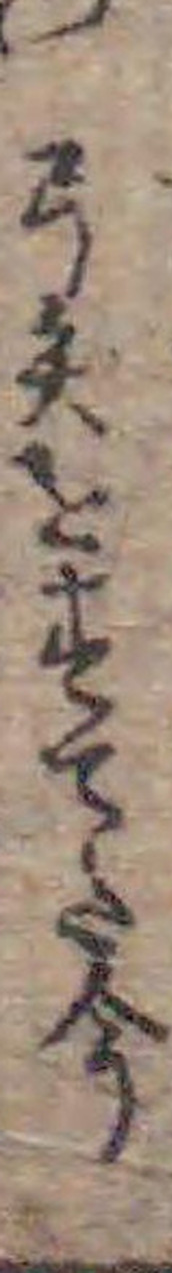弓矢をすてた今
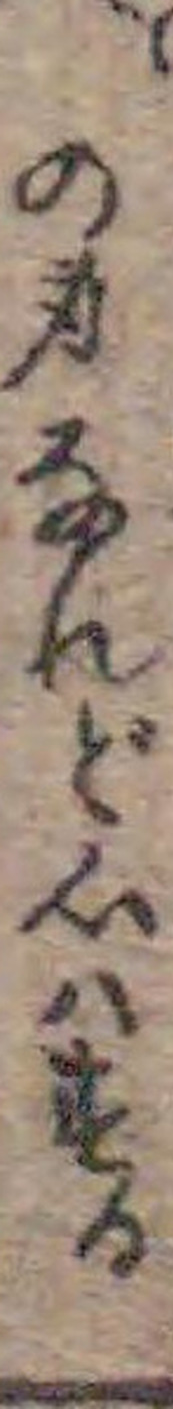の身なれど心はする
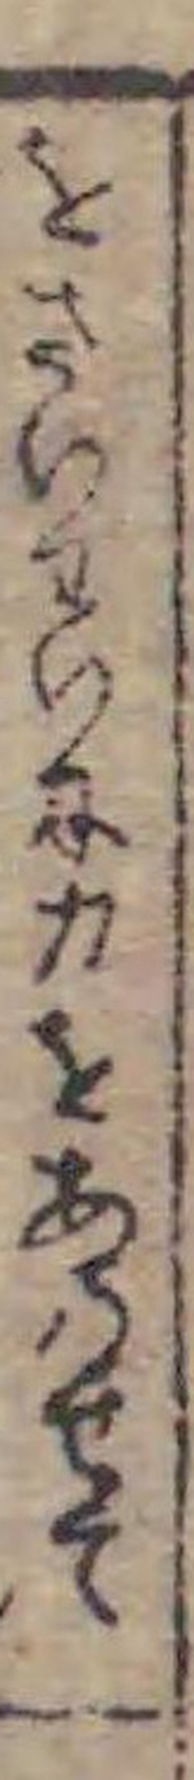をさいわいに力をあはせて
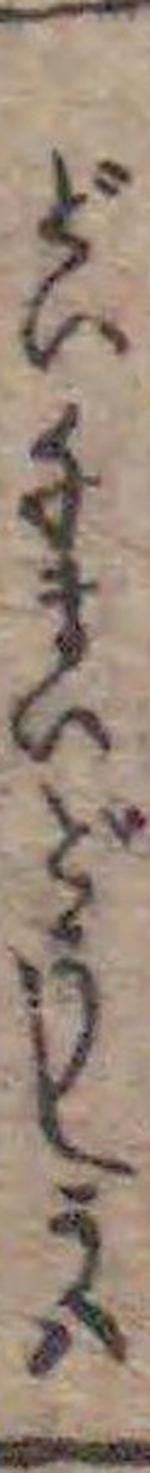どい千まいどうしうは
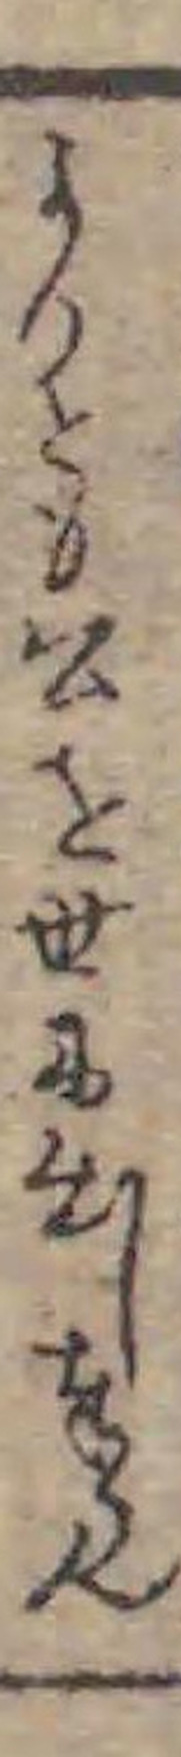よりとも公を世に出し奉らん
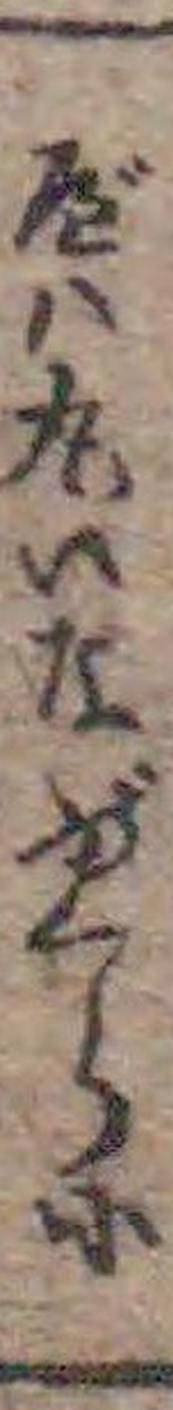べは丸いなぶくらに
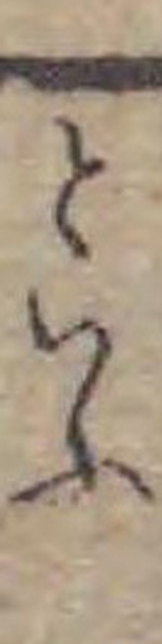といふ
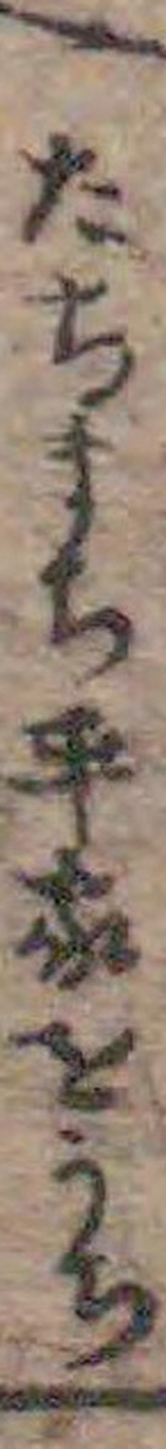たちまち平家をうち
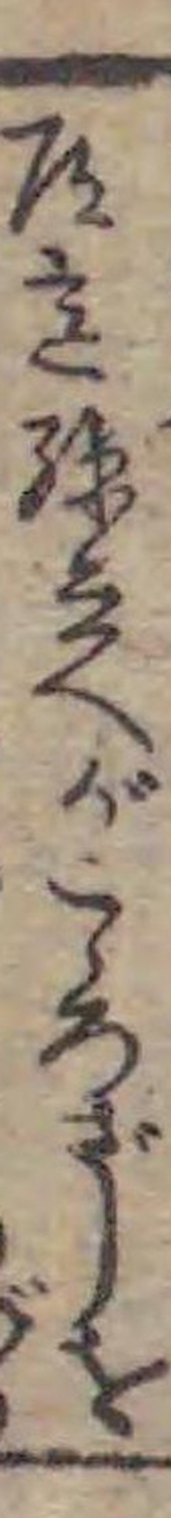道意孫兵へがこゝろざしを
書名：三舛増鱗組 : 3巻
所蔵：国立国会図書館 National Diet Library, JAPAN
